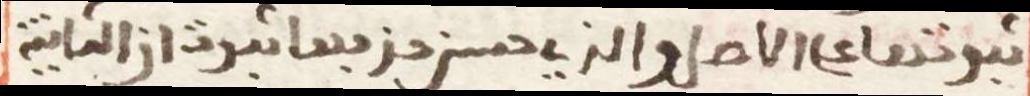ثبوتها على الأصل والذي حسن حذفها ثبوت ان الثنائية
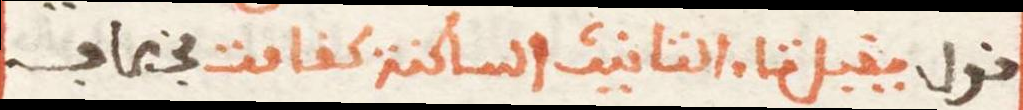قول يقبل تاء التانيث الساكنة كقامت بخلاف
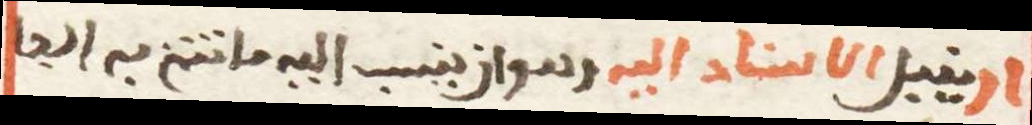ار يقبل الاسناد اليه وهو ان ينسب اليه ما تتم به الفا
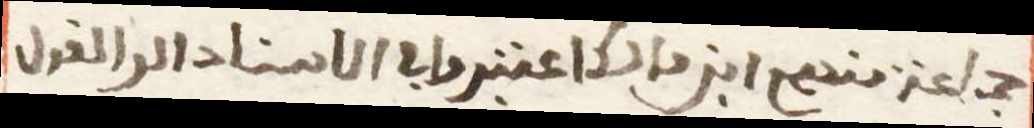جماعة منهم ابن مالك اعتبروا في الاسناد الى القول
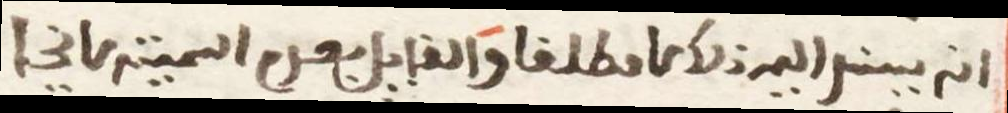ان يسند اليه ذلك لا مطلقا والقايل بحرم اسميته لا يخا
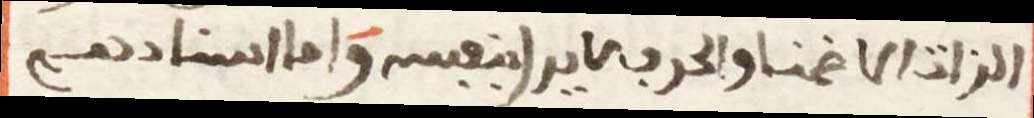الذات لاضمنا والحرف لا يدل بنفسه واما اسنادهم
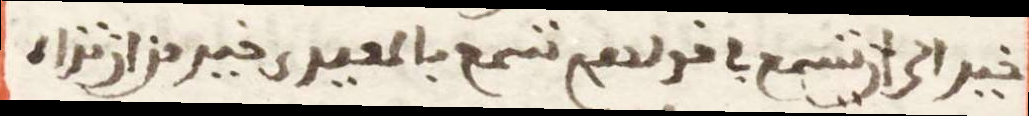خير الى ان تسمع في قولهم ان تسمع بالمعيدي خير من ان تراه
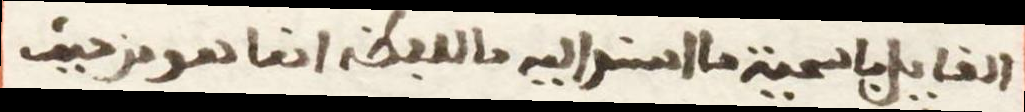القايل باسمية ما اسند اليه ما للفظه انما هو من حيث
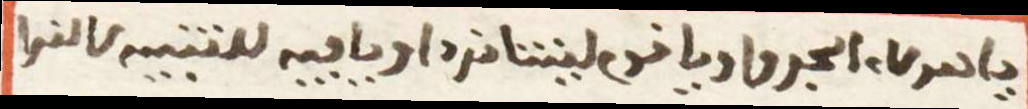ياهؤلاء المجرور وياقوم لينتنا فردا اويافيه للتنبيه لالقر
